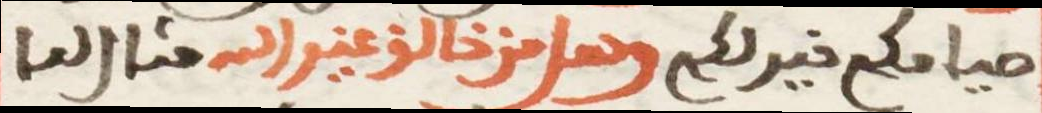صيامكم خير لكم وهل من خالق غير الله مثال لما دخل
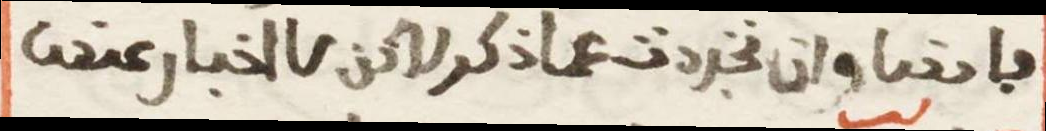فانها وان تجردت عما ذكر لكن لا اخبار عنها
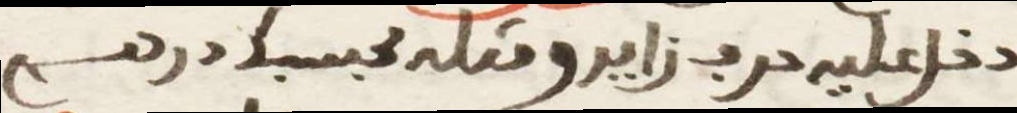عليه حرف زايد ومثله بحسبك درهم
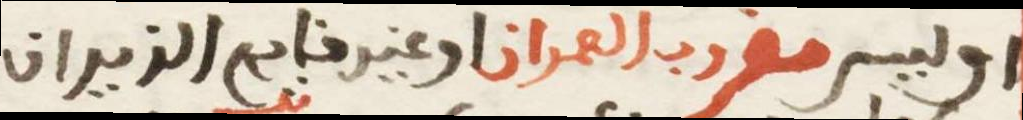او ليس مضروب العمران او غير قائم الزيدان
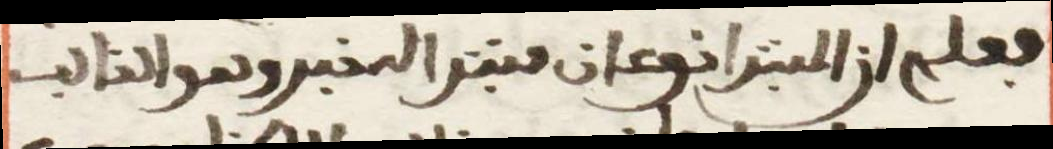فعلم ان المبتدا نوعان مبتدا له خبر وهو الغالب
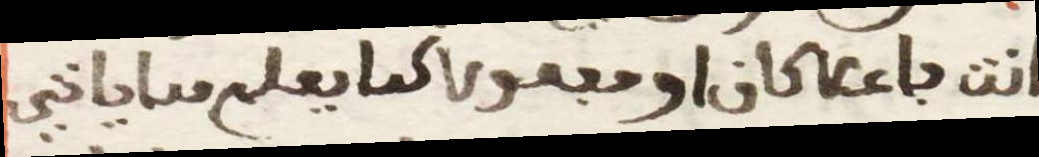انت فاعلا كان اومفعولا كما يعلم مما يأتي
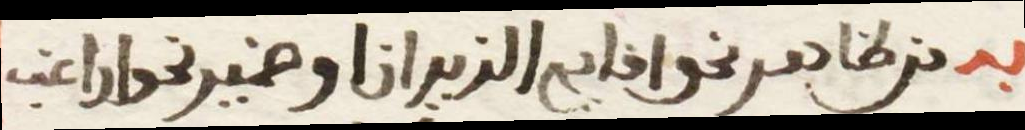به من ظاهر نحو قايم الزيدان او ضمير نحو اراغب
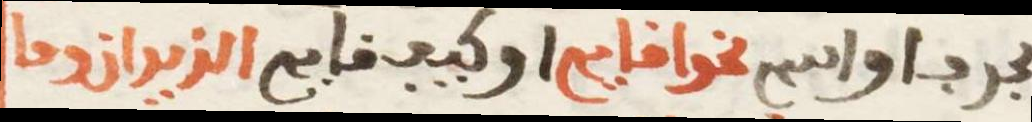بحرف اواسم نحو اقايم او كيف قايم الزيدان وما
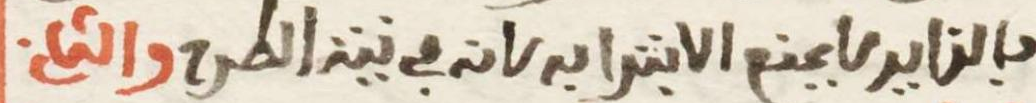فالزائد لا يمنع الابترا به لانه في نية الطرح والثاني
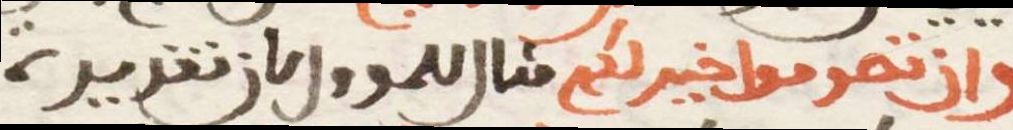وان تصوموا خير لكم مثال للمؤول لان تقريرة
